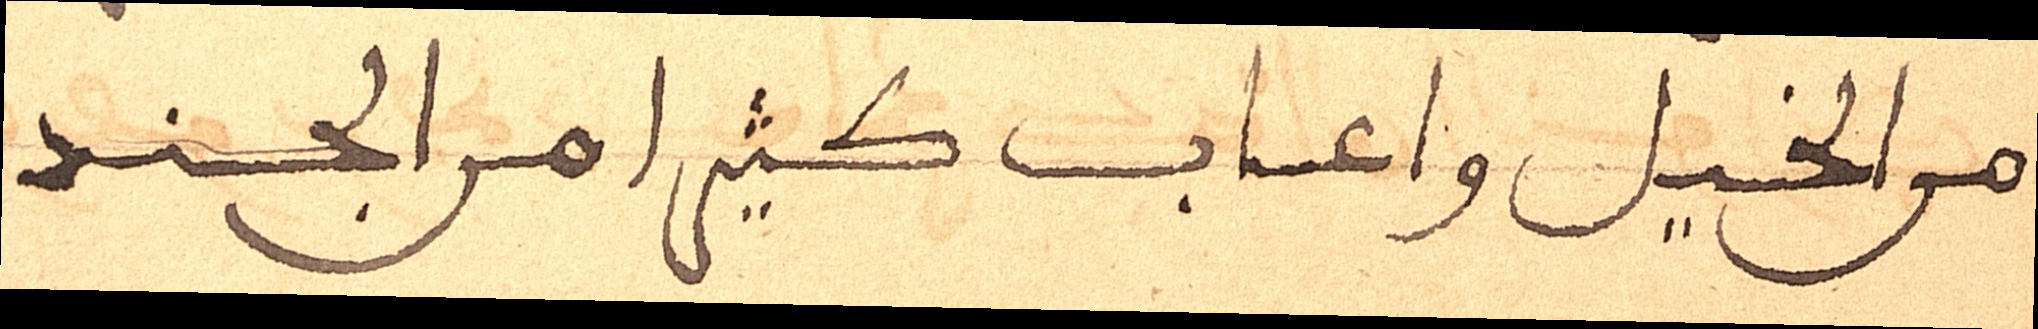من الخيل واعاب كثيرا من الجند
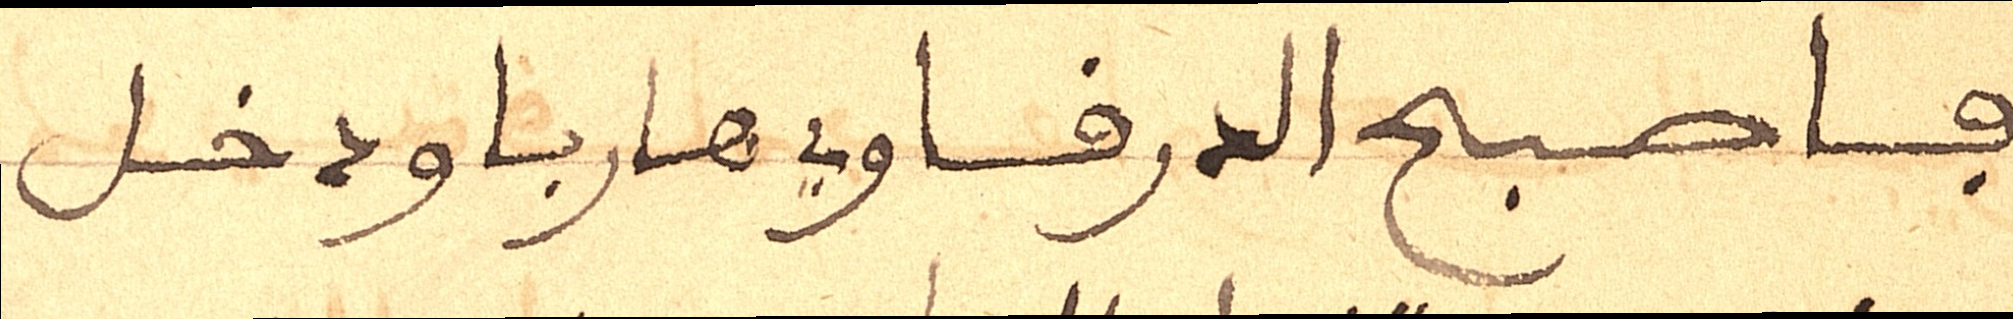فاصبح الدرقاوي هاربا ودخل
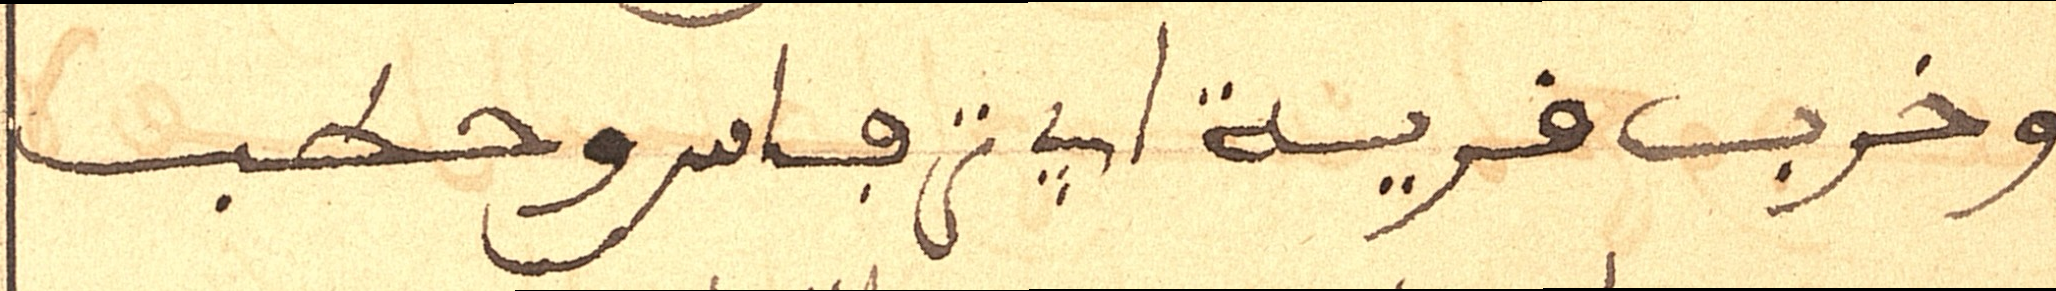وخرب قرية اي ترفاس وحطب
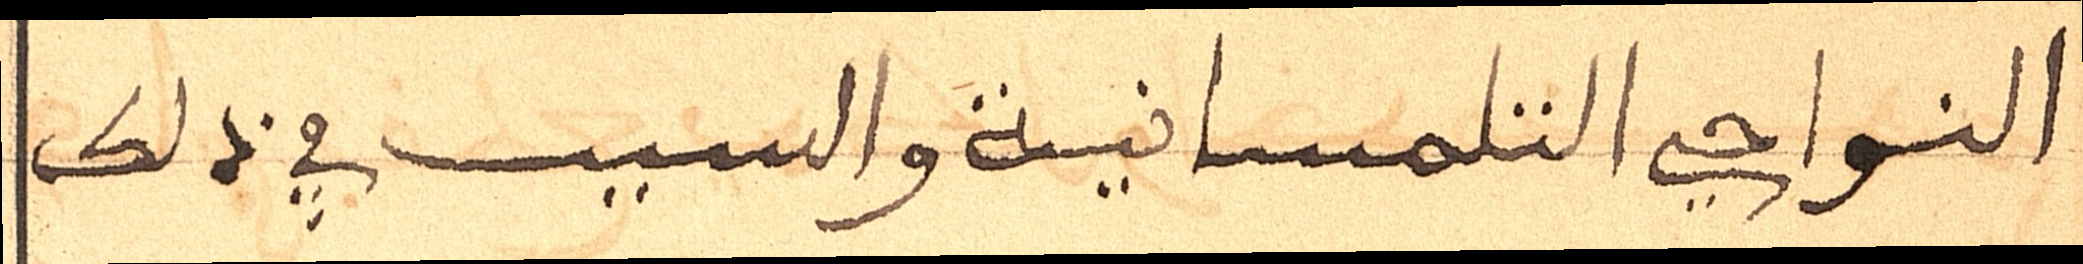النواحي التلمسانية والسبب في ذلك
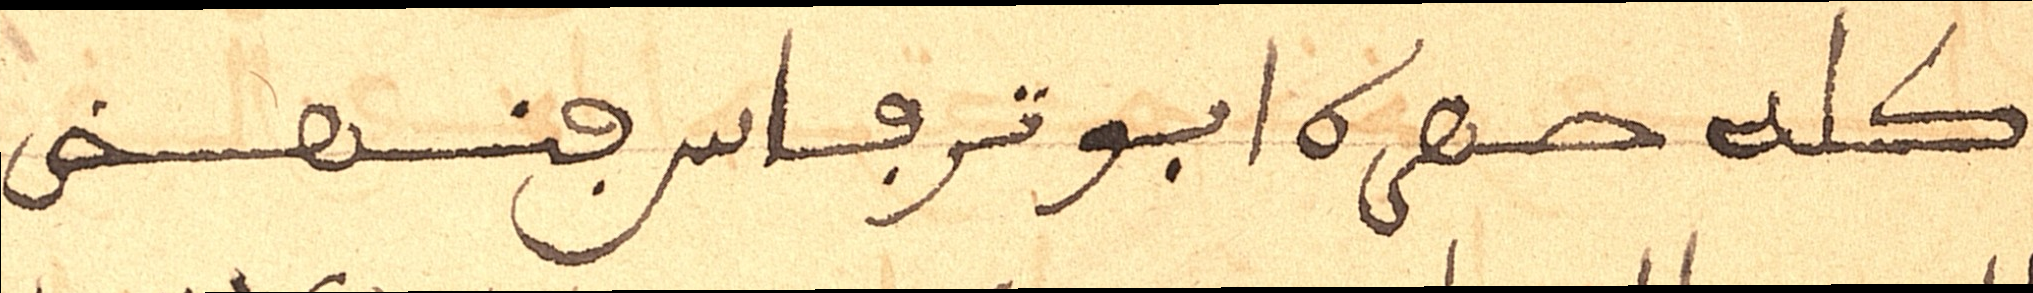كله صهره ابو ترفاس فنهض
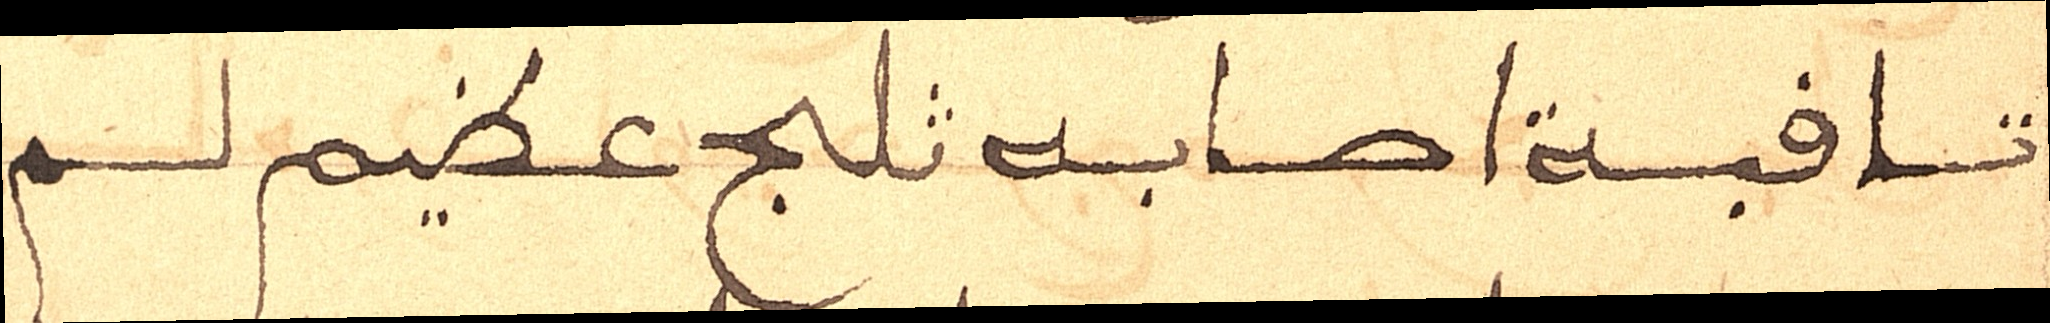تاقبة اصابه ثلج عظيم لم
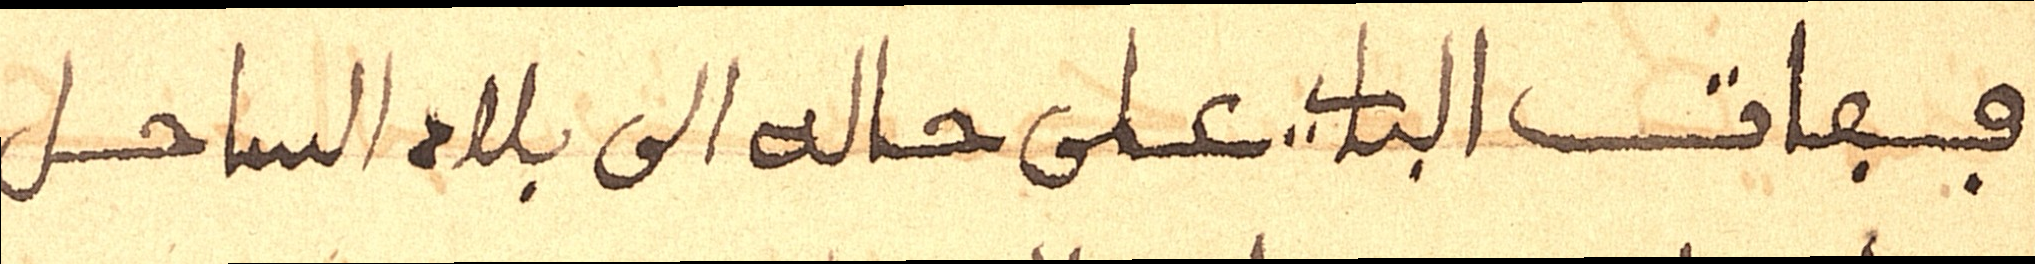ففات الباي على حاله الى بلاد الساحل
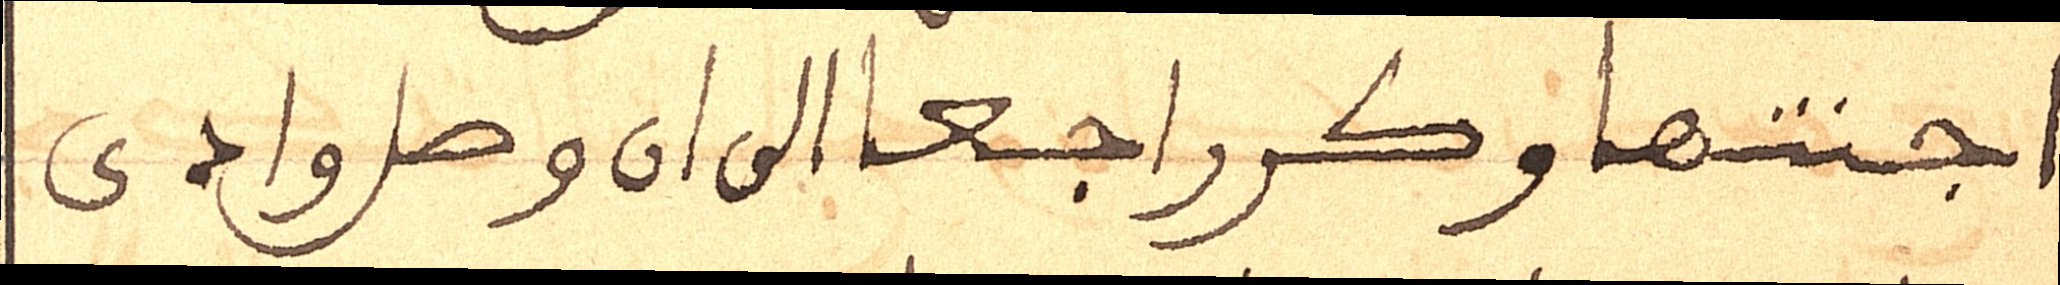اجنتها وكر راجعا الى ان وصل وادى
